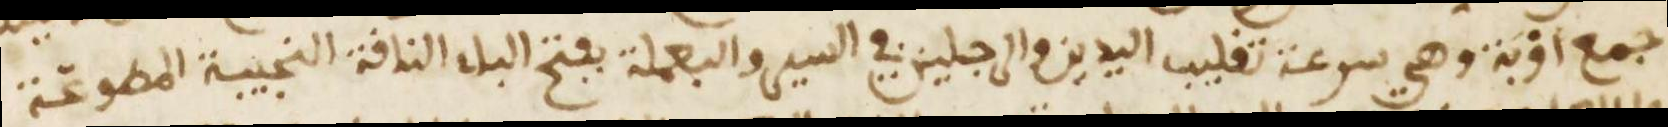جمع أوبة وهي سرعة تقليب اليدين والرجلين في السير و البعملة بفتح الباء الناقة النجيبة المطوعة
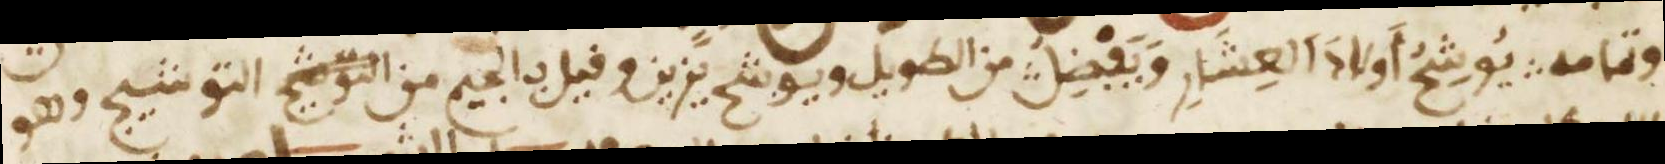و تمامه يوشح أولاد العشار و يفضل من الطويل و يوشح يزين و قيل بالجيم من التوشيج و هو
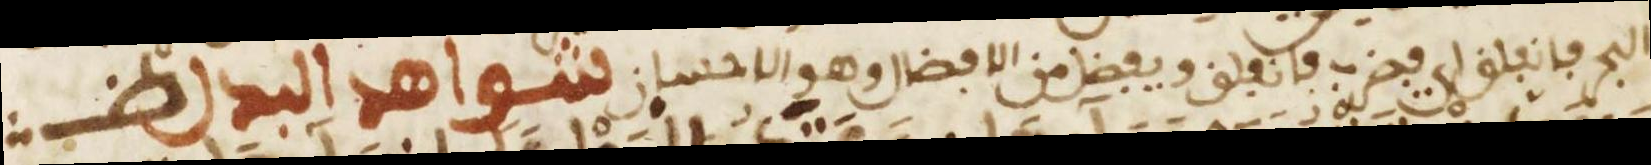البحر فانفلق اي فضرب فانفلق و يفضل من الافضال و هو الاحسان شواهد البدل ظ
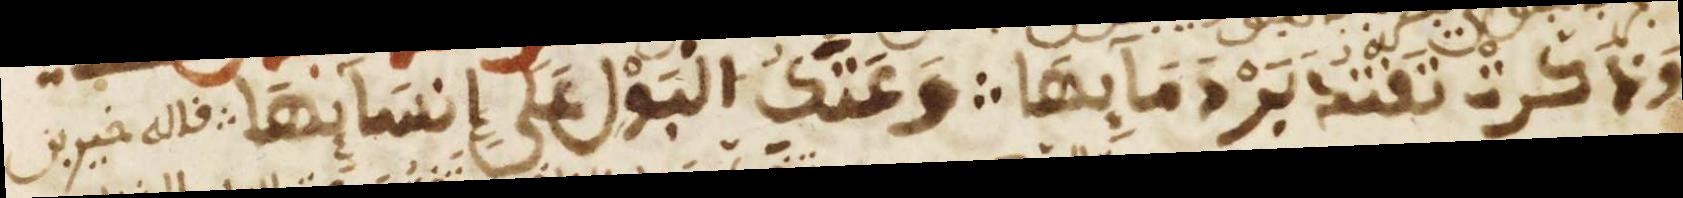و ذكرت تقتد برد مائها وعتك البول على إنسائها قاله خير بن
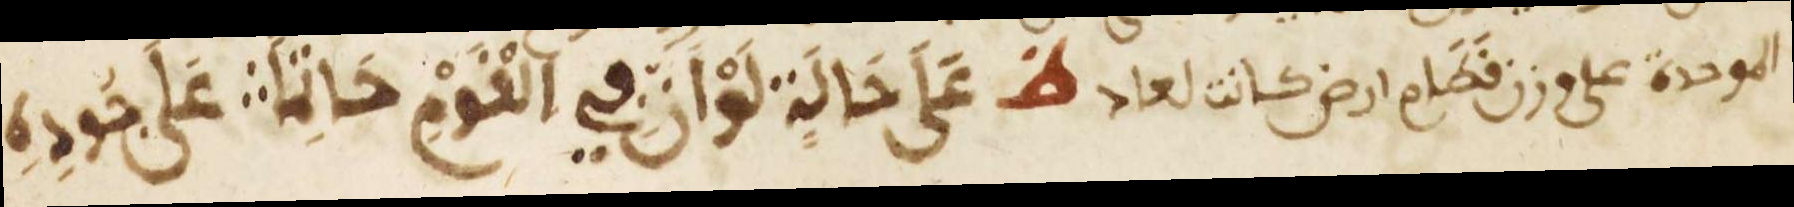الموحدة على وزن قطام ارض كانت لعاد ظ على حالة لو أن في القوم حاتما على جوده
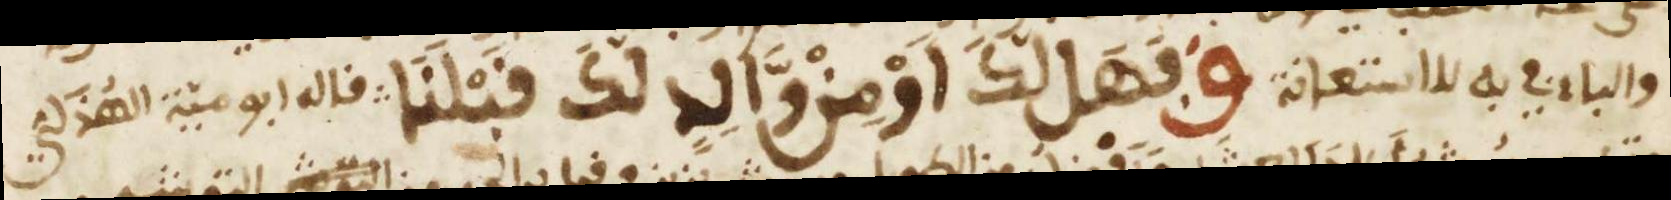و الباء في به للاستعانة ق فهل لك أو من والد لك قبلنا قاله ابو مية الهذلي
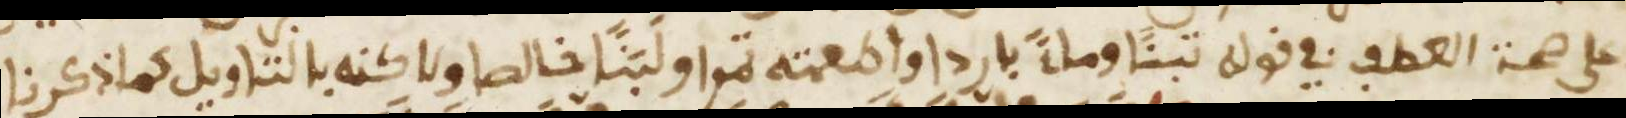على صحة العطف في قوله تبنا و ماء باردا و أطعمته تمرا و لبنا خالصا و لاكنه بالتاويل كما ذكرنا
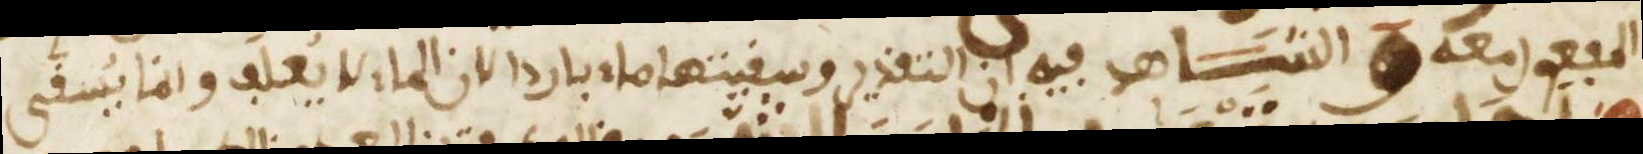المفعول معه و الشاهد فيه ان التقدير و سقيتها ماء باردا لان الماء لا يعلف و انما يسقى
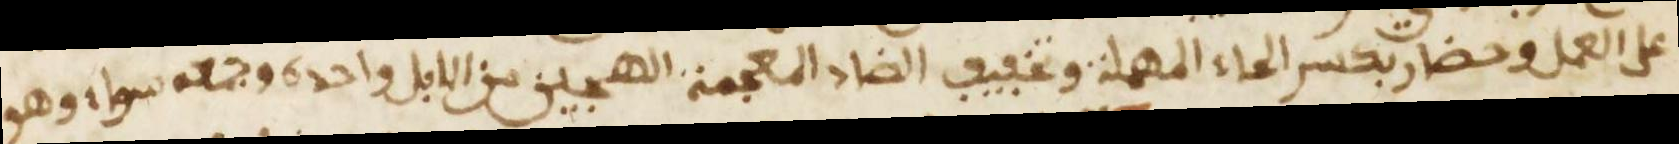على العمل و حضار بكسر الحاء المهملة وتخفيف الضاد المعجمة الهجين من الابل واحده و جمعه سواء وهو
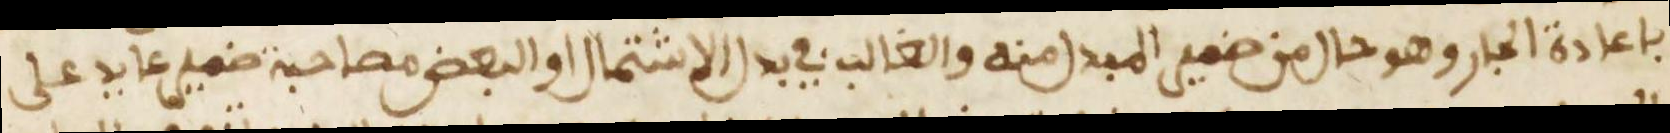باعادة الجار وهو حال من ضمير المبدل منه و الغالب في بدل الاشتمال او البعض مصاحبة ضمير عايد على
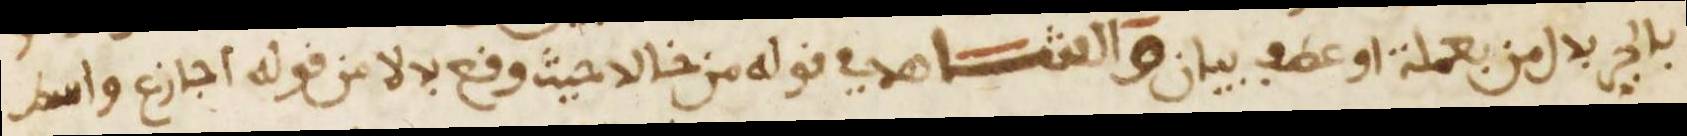بالجر بدل من بعملة او عطف بيان و الشاهد في قوله من خالد حيث وقع بدلا من قوله اجارع وأسط
